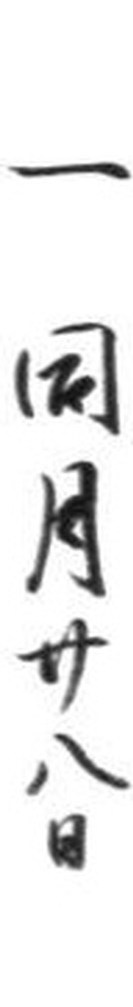一同月廿八日
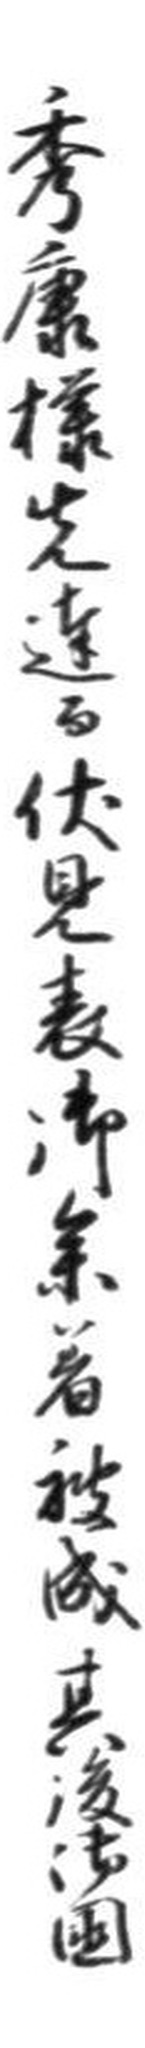秀康様先達而伏見表御参着被成其後御国
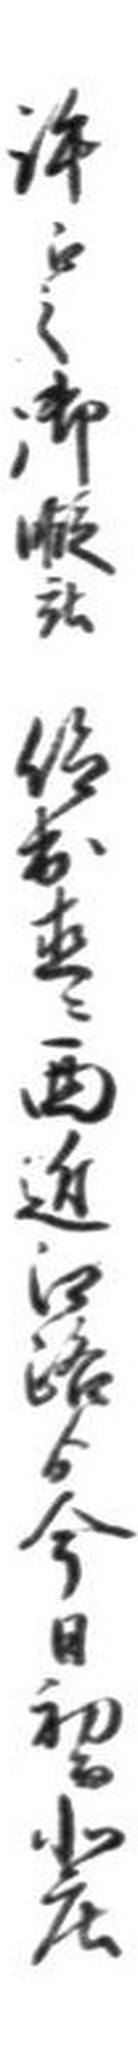許江之御暇被仰出直ニ西近江路ゟ今日初而北庄
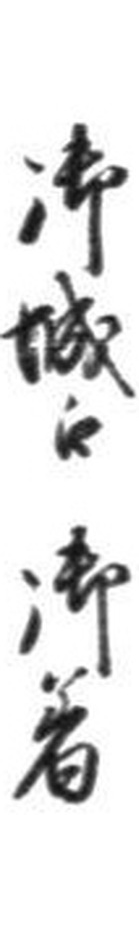御城江御着
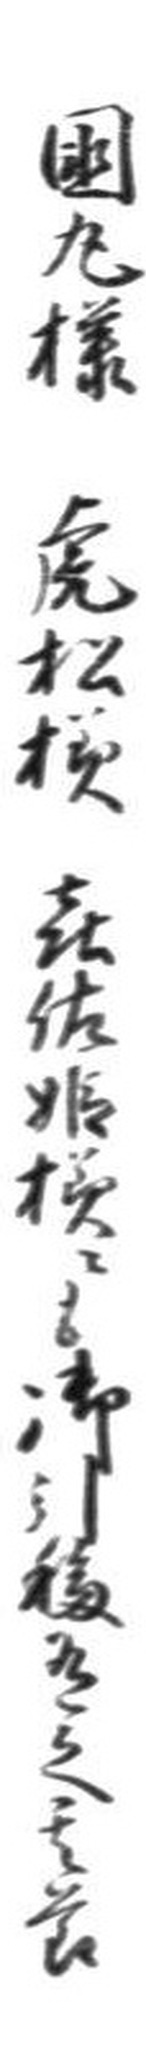国丸様虎松様喜佐姫様ニも御引移有之其節
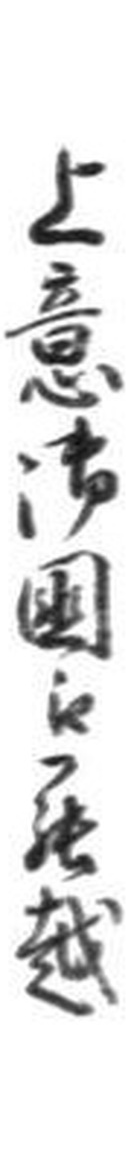上意御国江罷越
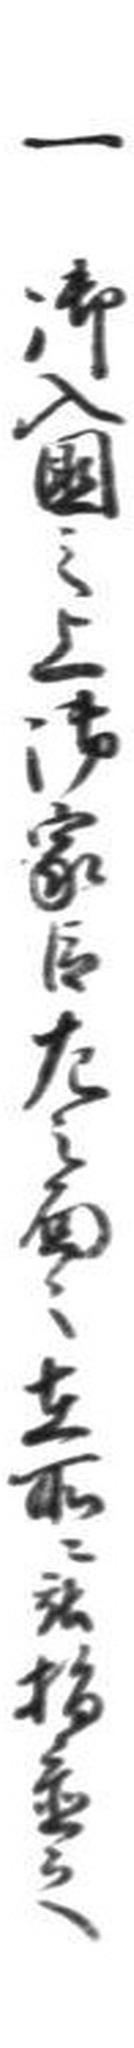一御入国之上御家臣左之面々在所ニ被指置之

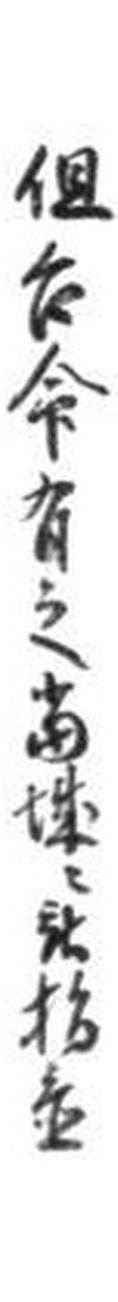但台命有之当城ニ被指置
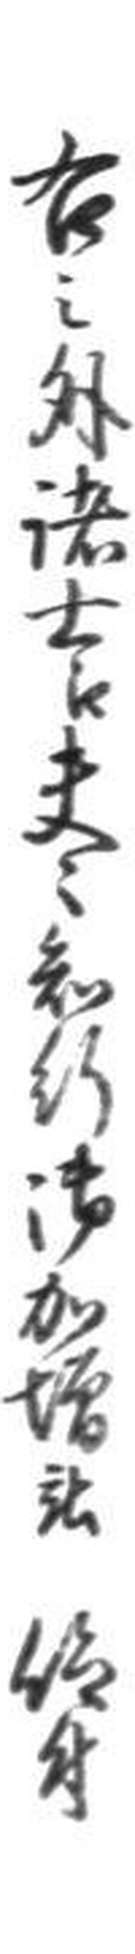右之外諸士江夫々知行御加増被仰付
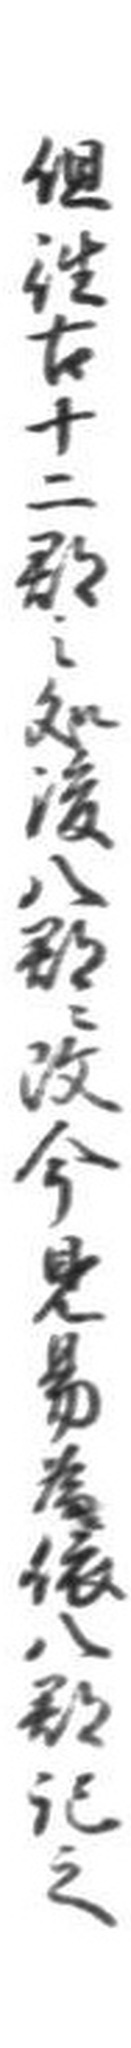但往古十二郡之処後八郡ニ改今見易為依八郡記之
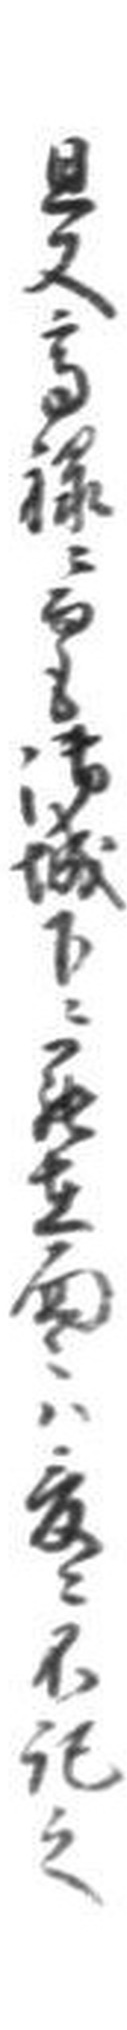且又高禄ニ而も御城下ニ罷在面々ハ爰ニ不記之
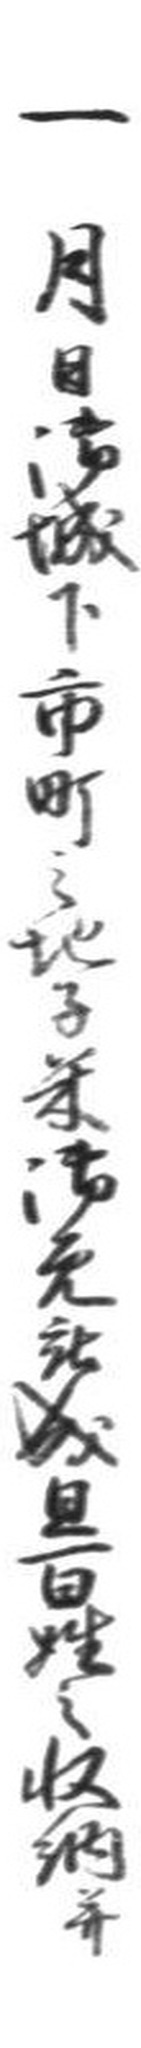一月日御城下市町之地子米御免被成且百姓之収納幷

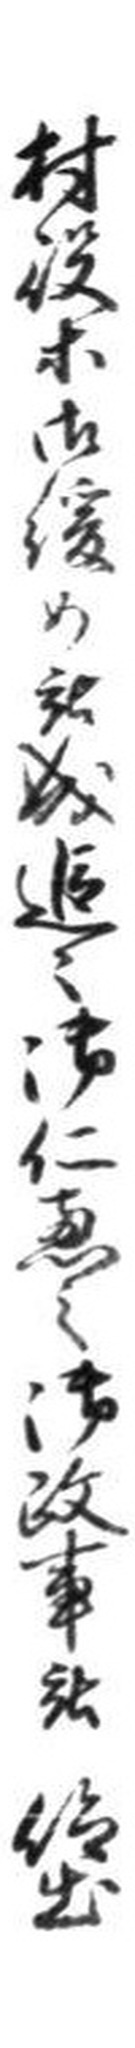村役等御緩め被成追々御仁恵之御改事被仰出
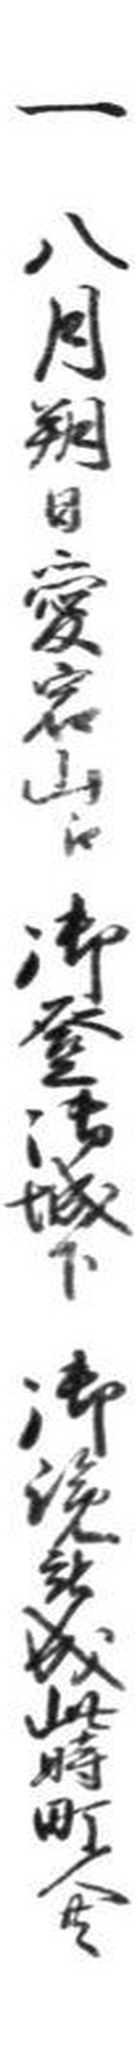一八月朔日愛宕山江御登御城下御覧被成此時町人共
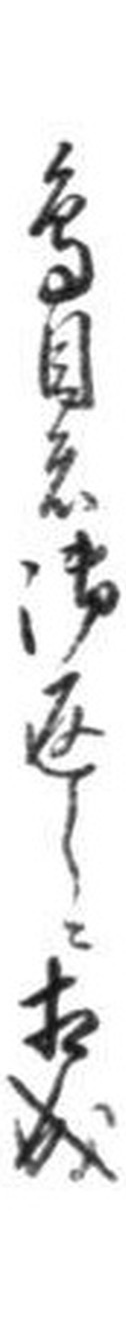鳥目者御返しニ相成
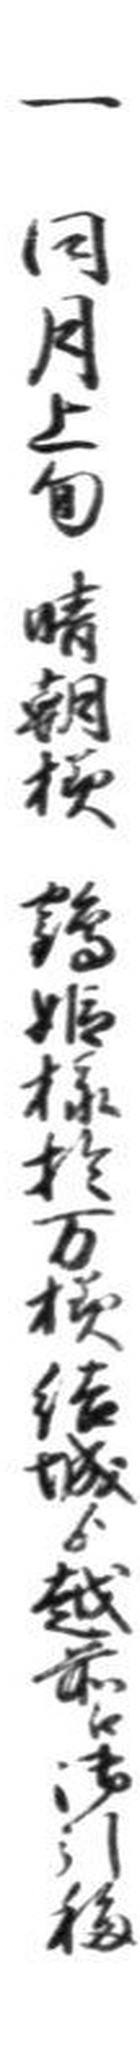一同月上旬晴朝様鶴姫様於万様結城ゟ越前江御引移
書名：家譜 一 秀康公 従天正二年到慶長十二年
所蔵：福井県文書館 Fukui Prefectural Archives
